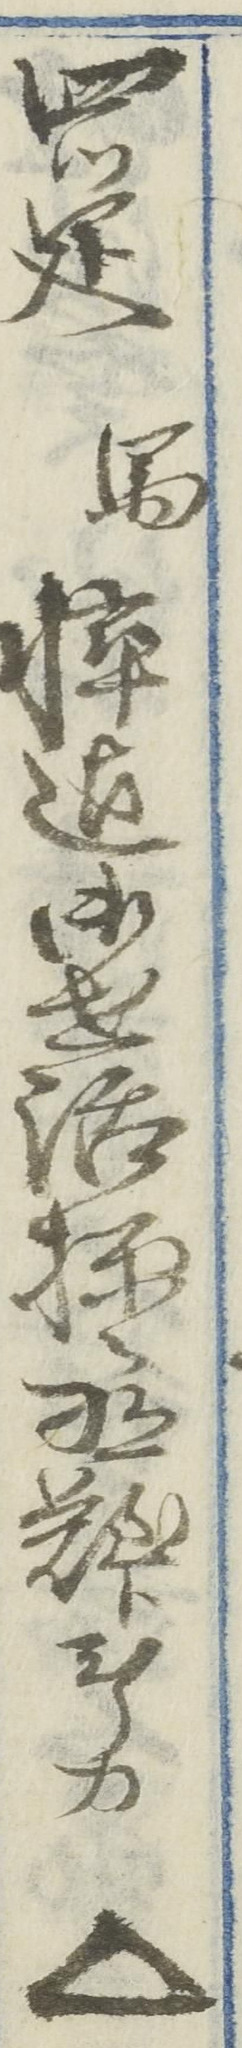四ツ足馬倅追御世話様ニ有難ト云カ
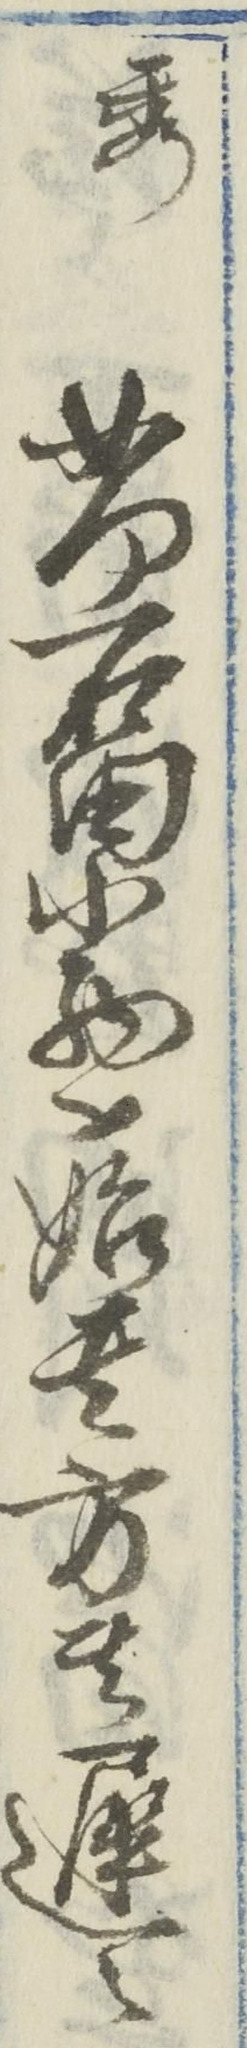秀如何石田小西ヲ始其方共遅之
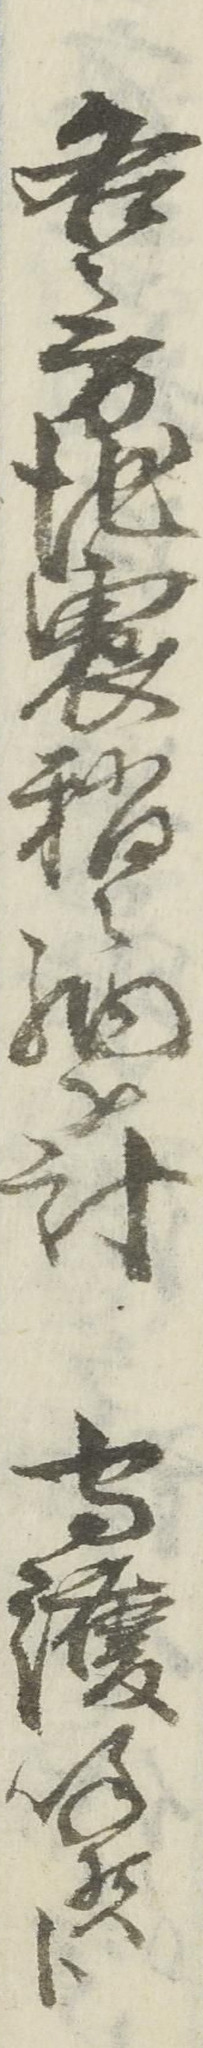清各々方地震稍ニ納ヲ計守護呼候ト
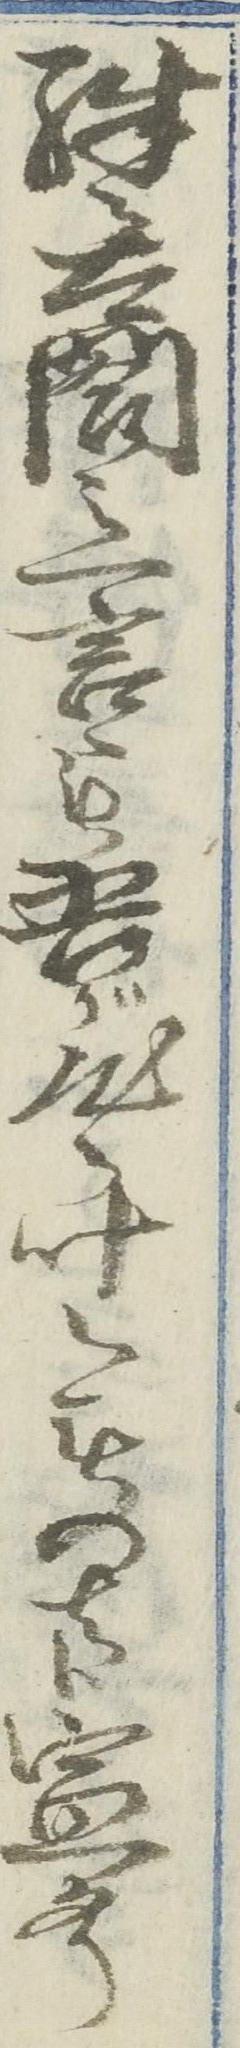殊ニ太閤之一言にも吾が心叶たものはト宣タリ
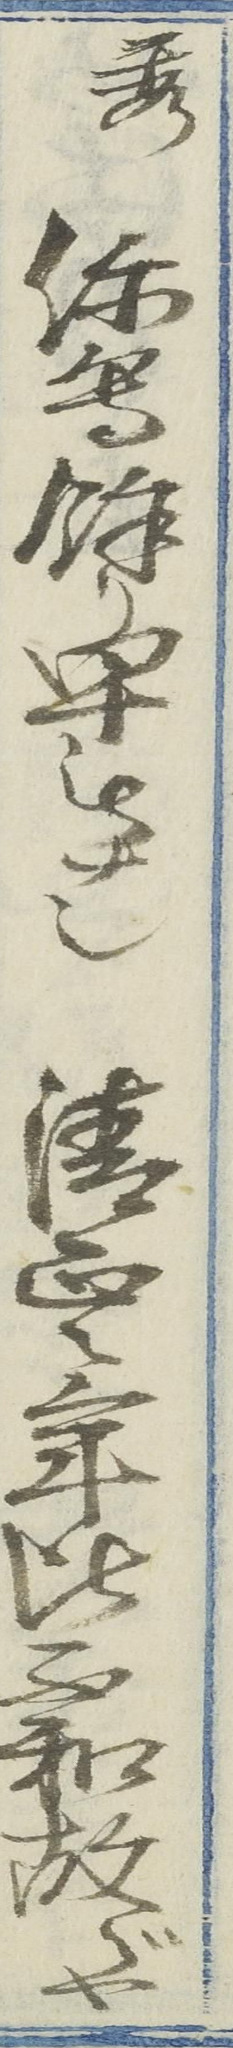秀你等餘り早もナシ清正之年比不和故ぢや
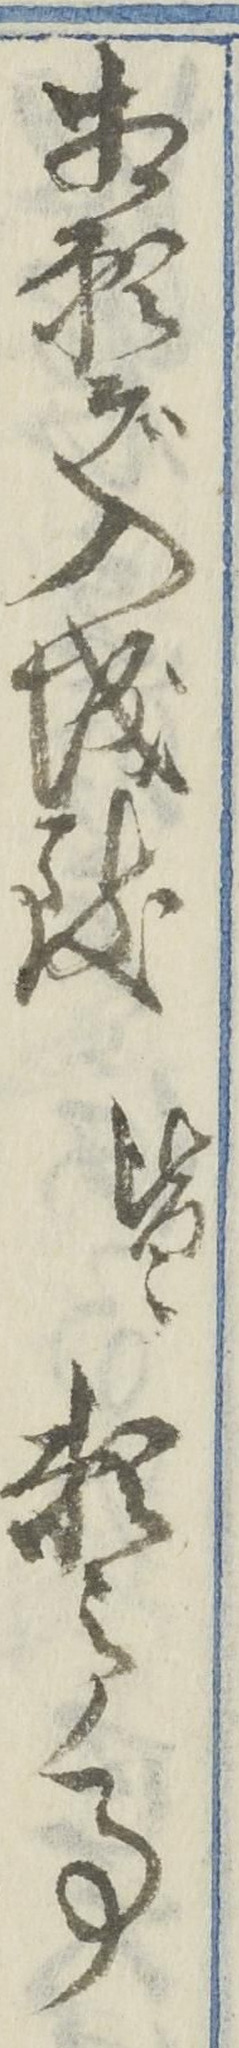相頼デ入城致皆〻頼ミノ事
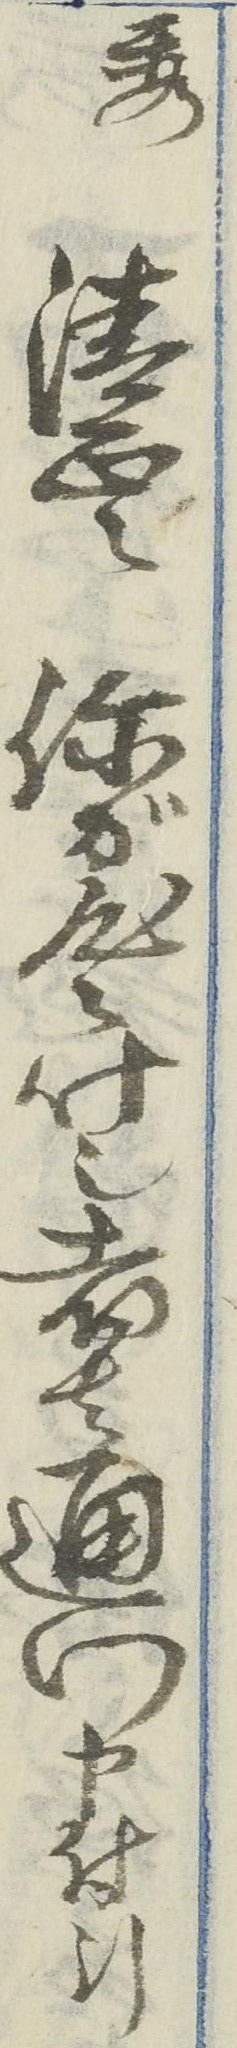秀清正之你が心ニ叶シ者は通門申付リ
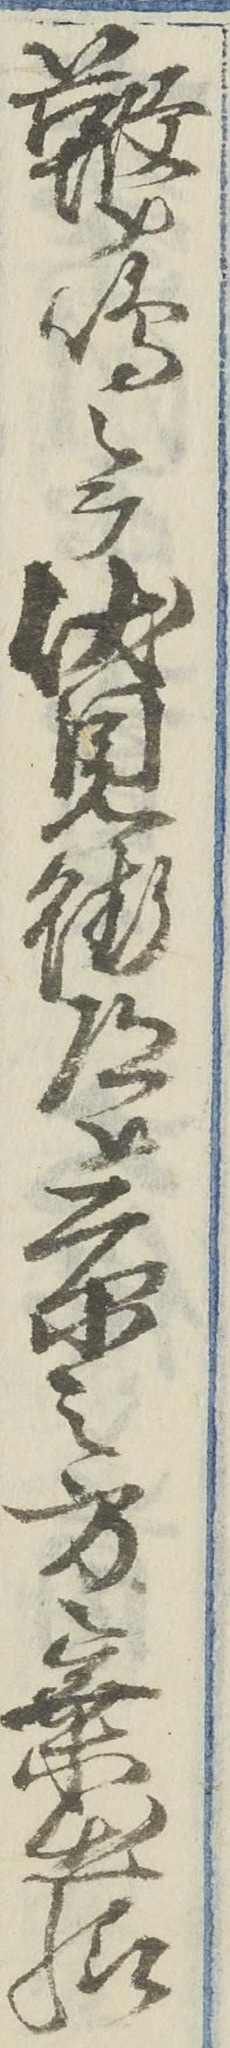鞭ヲ鳴シテ伏見街道ヲ京之方ニ乗出給
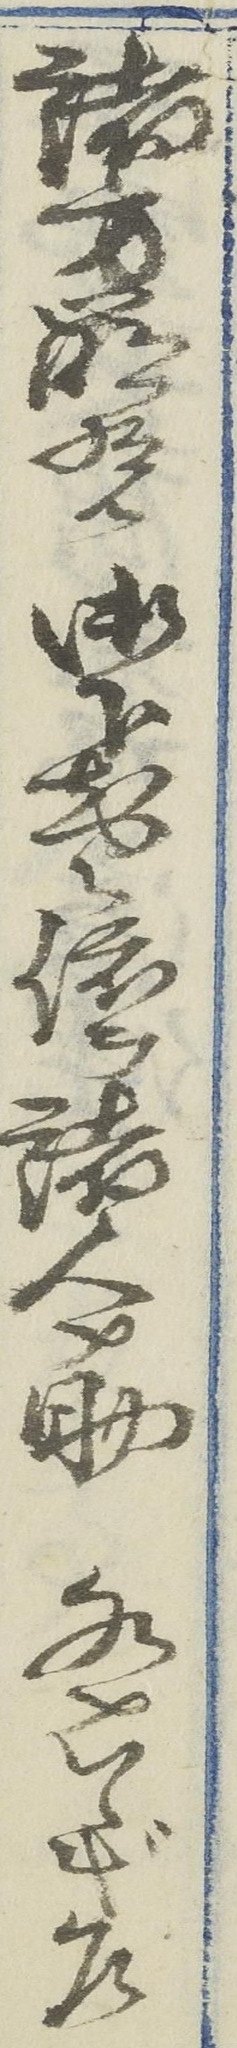諸方崩有ル御下知ニ依テ諸人ヲ助水ヲソヽギ乍
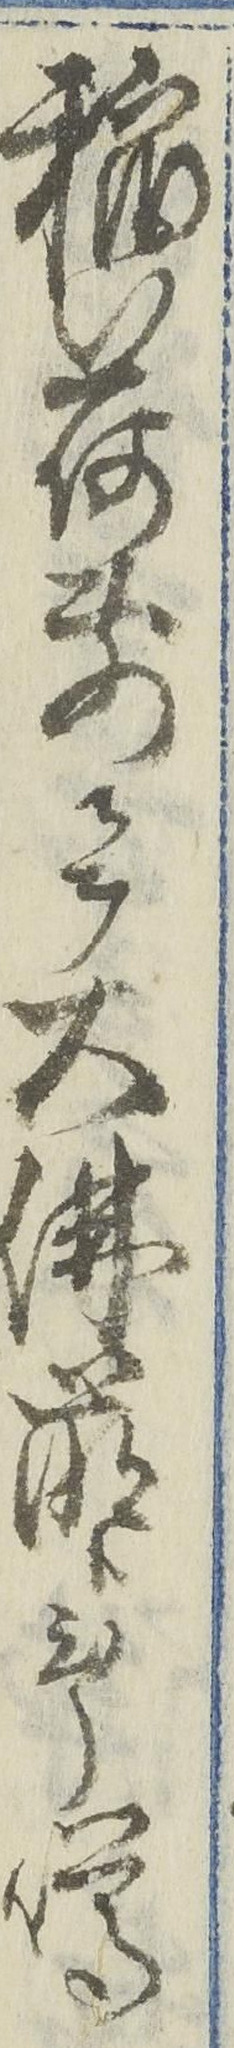稲荷前ニテ大仏崩ト云う噂

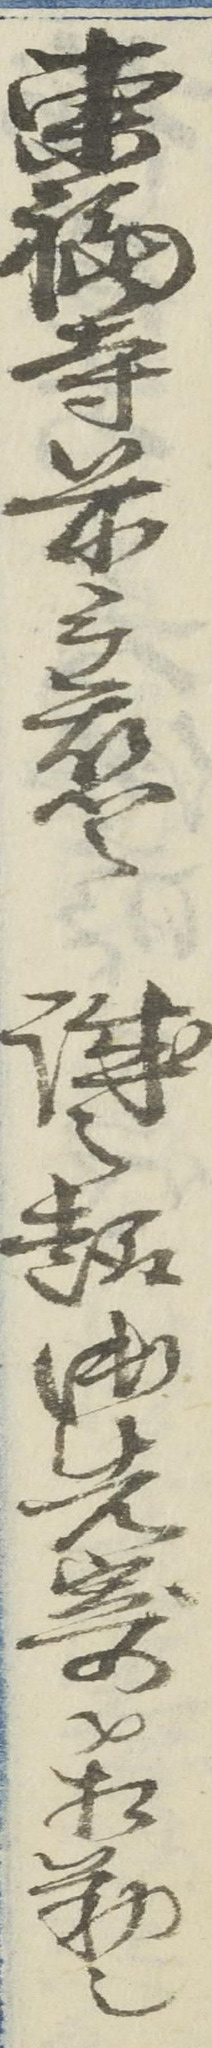東福寺前ニテ應し誠之趣御先寄を相勤シ
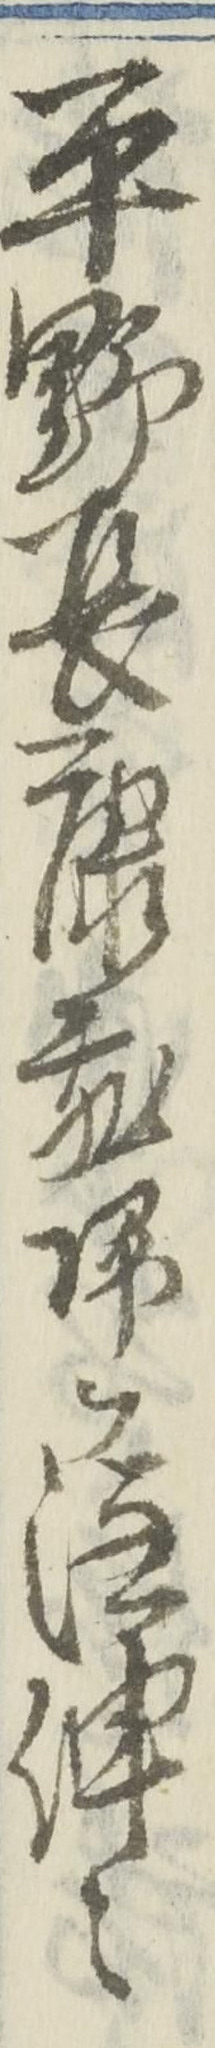平野長康殿帰ケ伸々
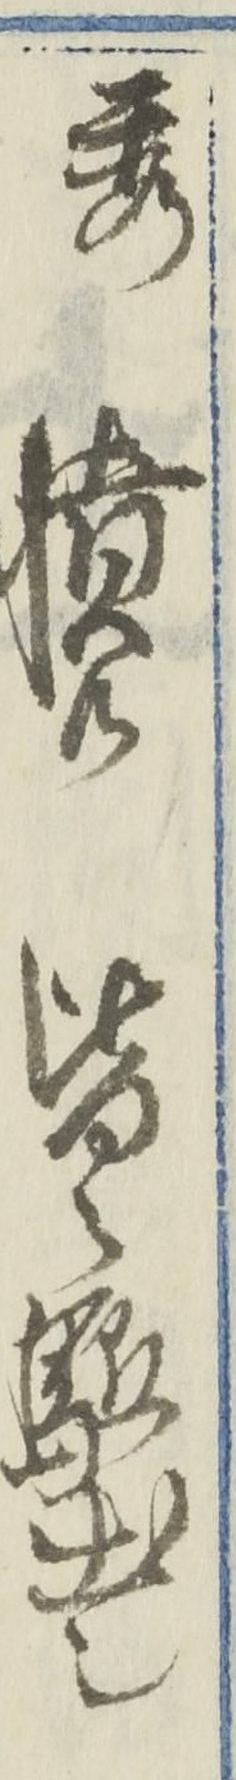秀噴ル皆々駈出シ
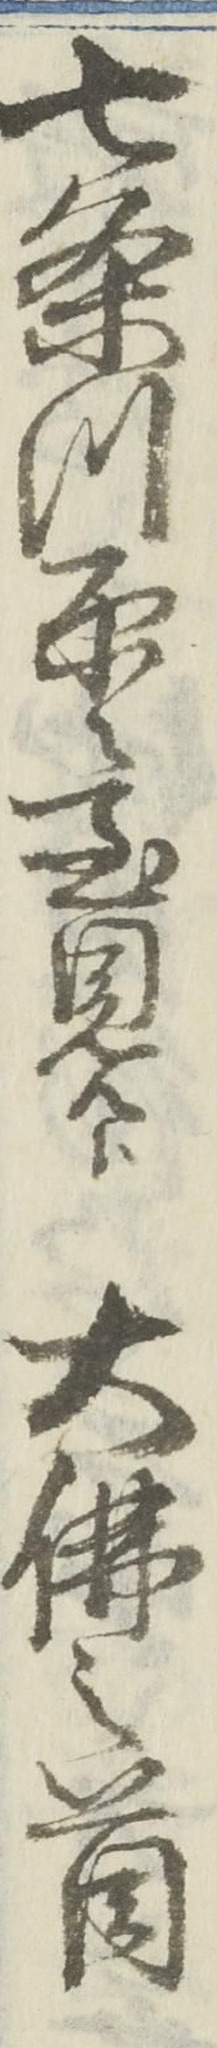七条川原ニ至見ルト大仏之首
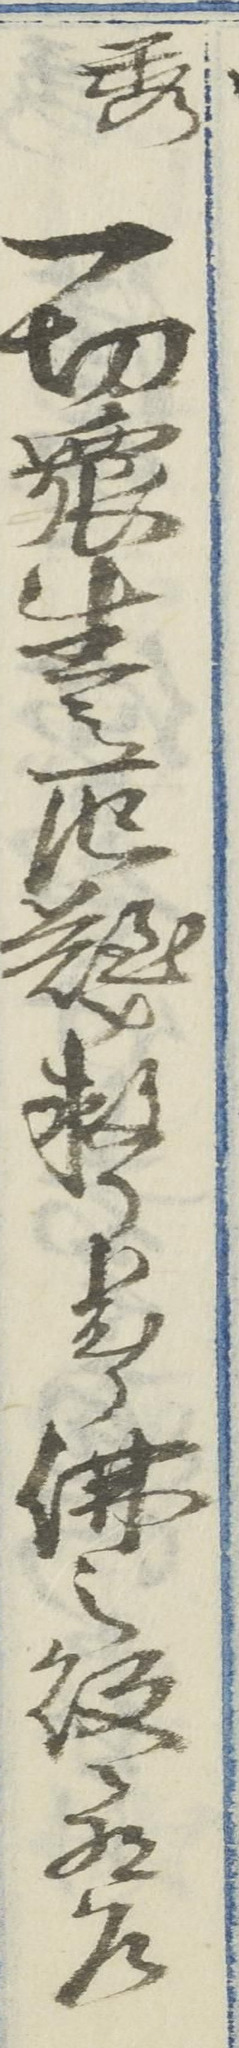秀一切衆生之厄難ヲ救うト云う仏之役ニ有乍
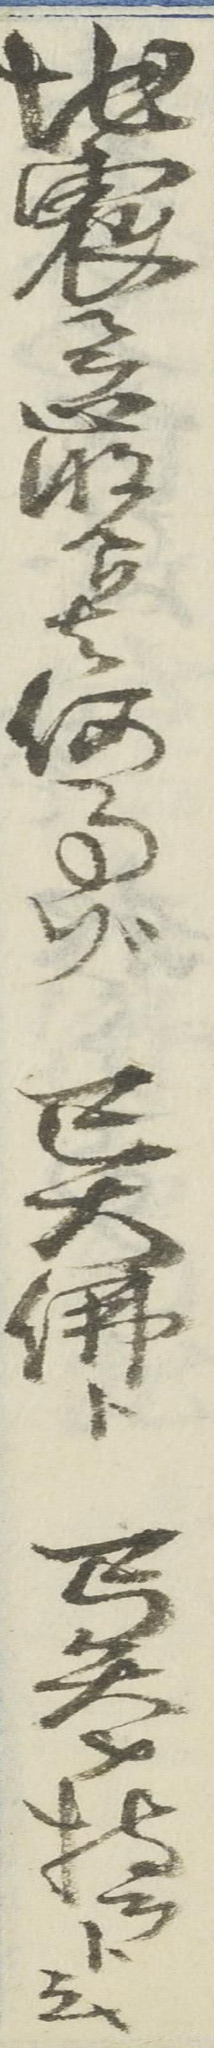地震ニテ崩ルトは何事ゾ己大仏ト弓矢ヲ持テト云
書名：伏水大地震
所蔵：東京大学地震研究所図書室 Earthquake Research Institute Library, The University of Tokyo, JAPAN
